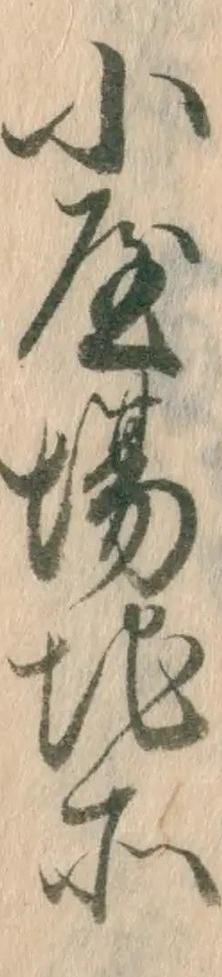小屋場地所

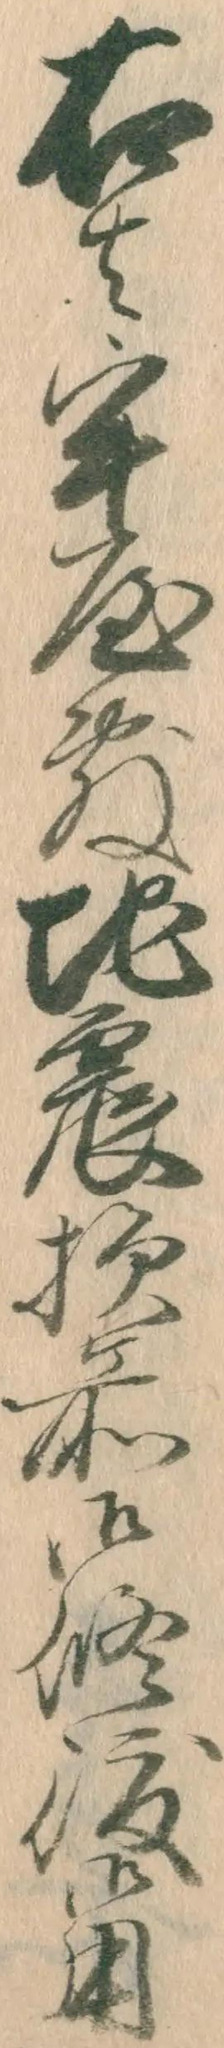右は牢屋敷地震損ケ所御修復御用
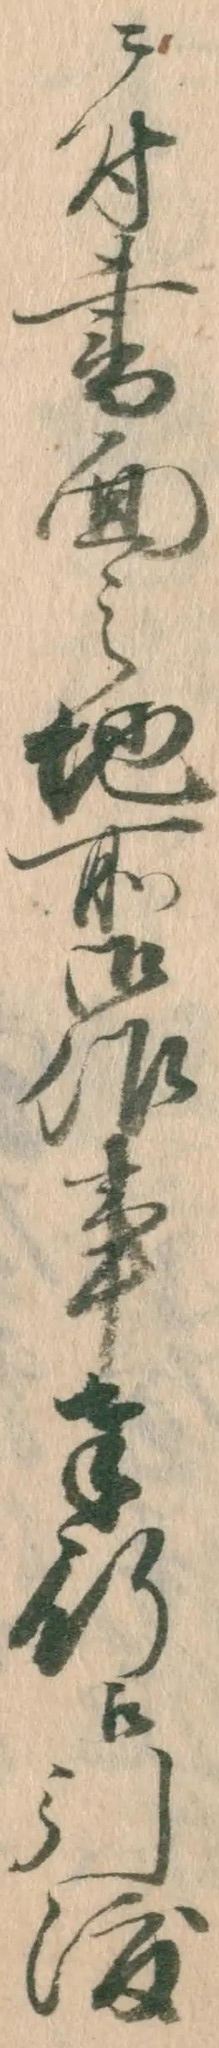ニ付書面之地所御作事奉行え引渡
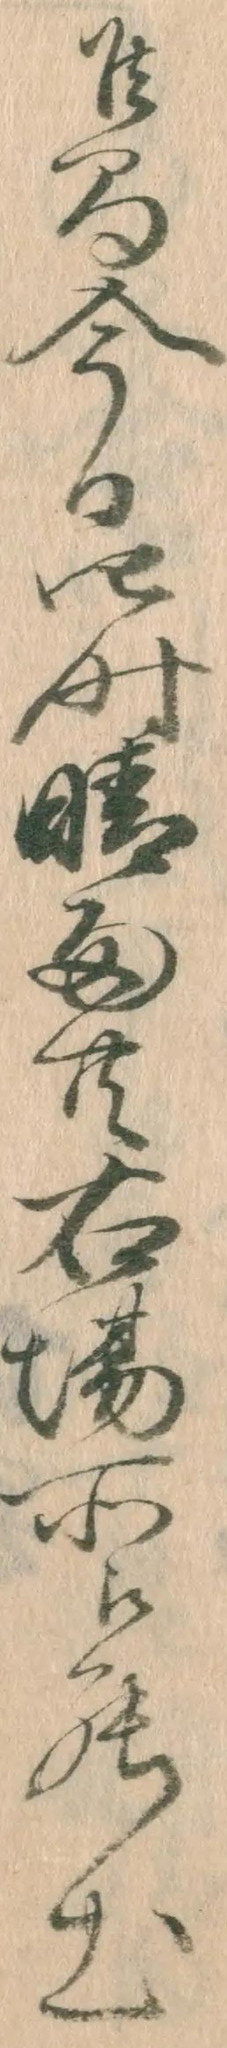候間今日四時晴雨共右場所え罷出
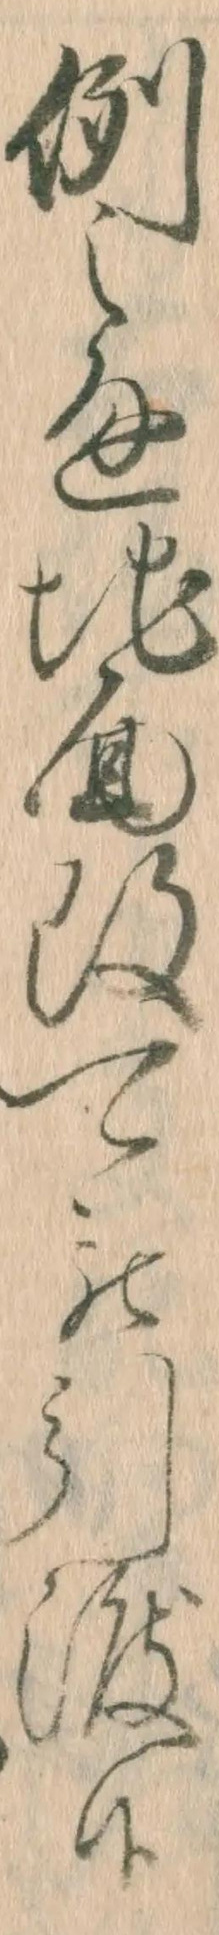例之通り地面改可被引渡候
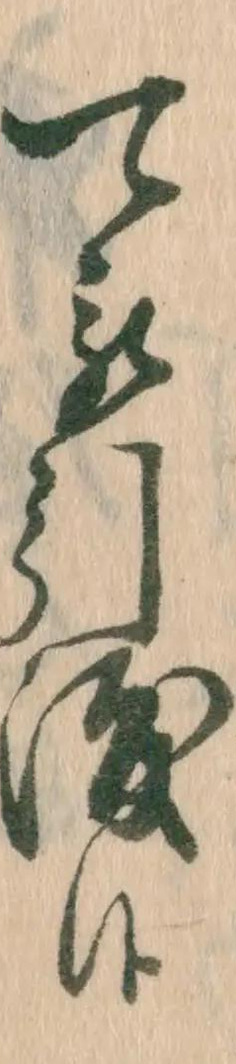可被引渡候
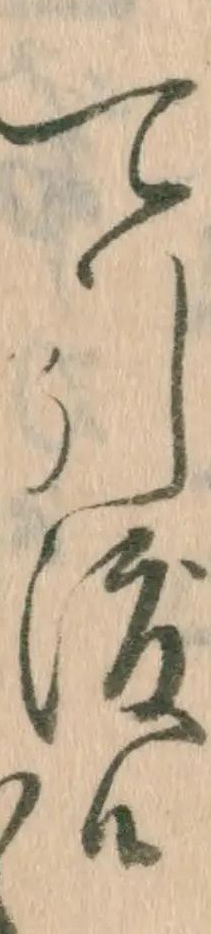可引渡候
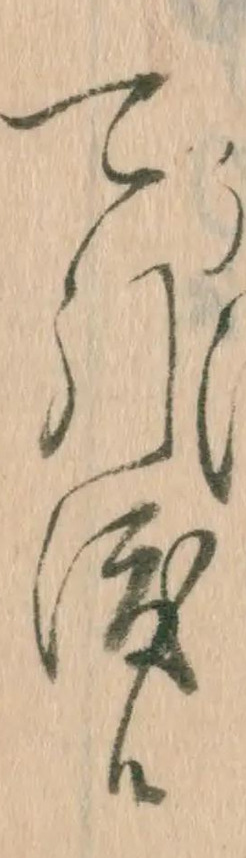可引渡候
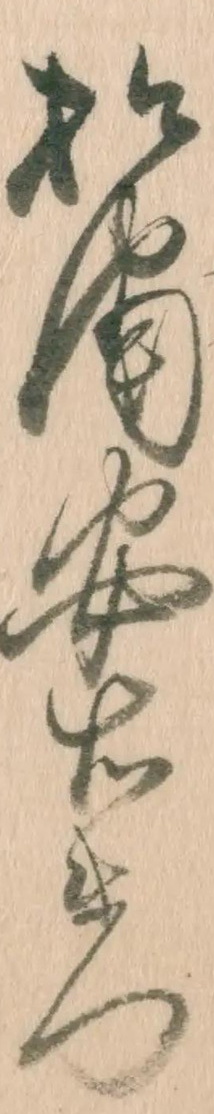松浦安右衛門
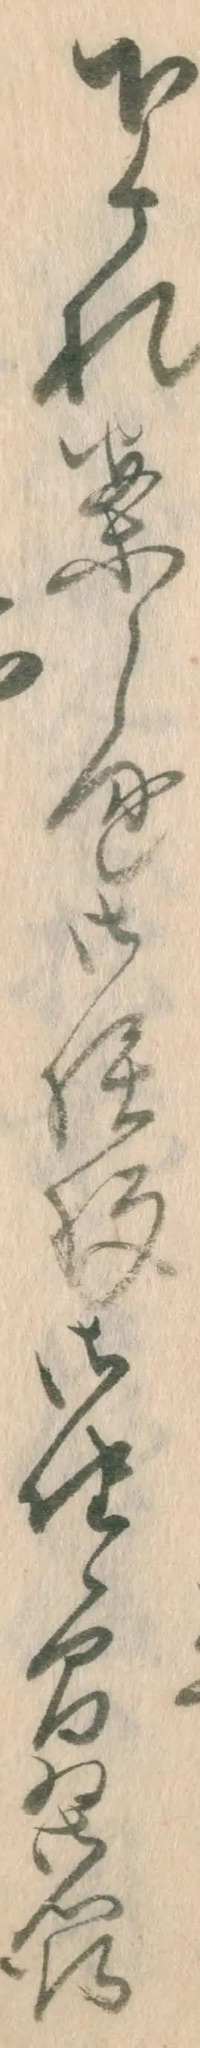下ケ札案之通御挨拶御座候間為御心得

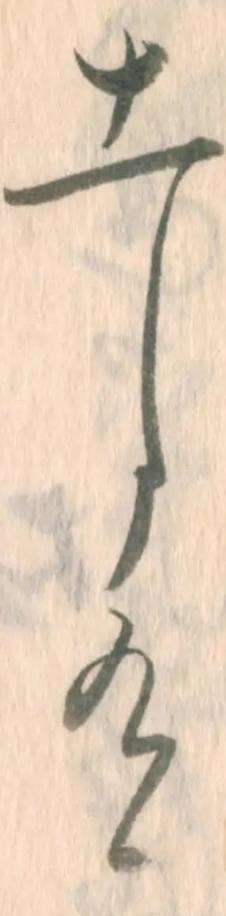十一月九日
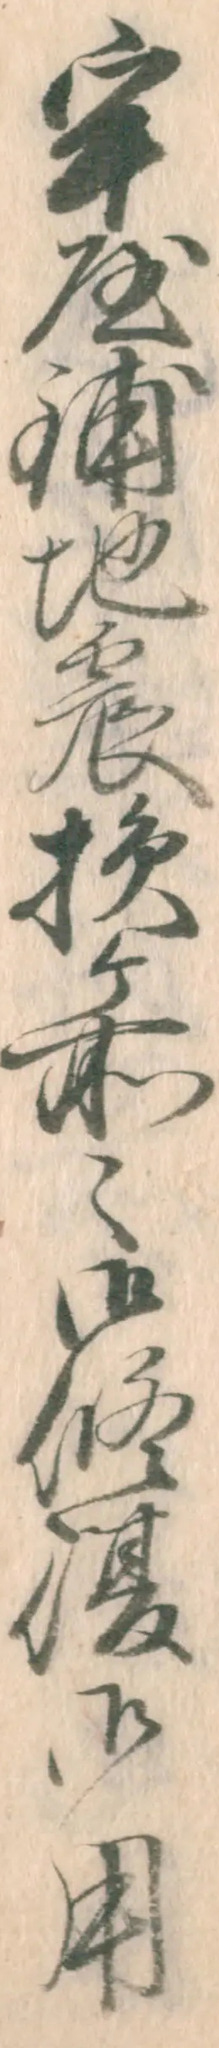牢屋鋪地震損ケ所〻御修復御用
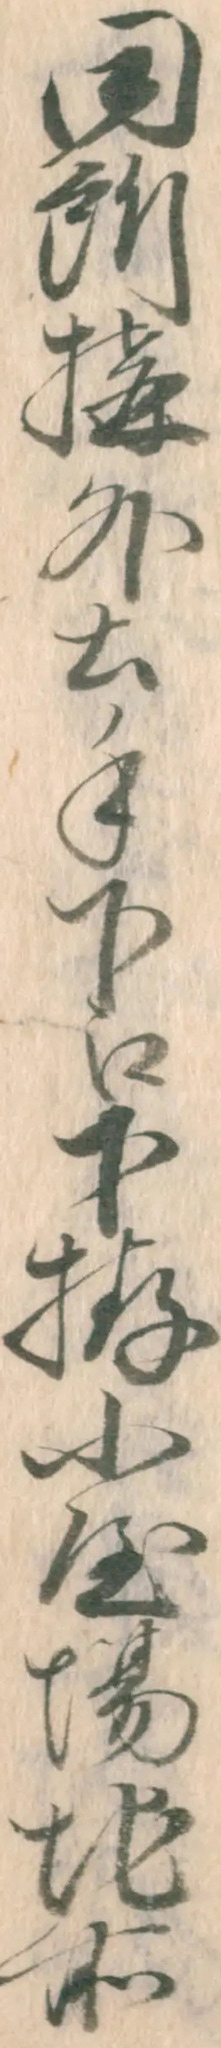同所構外土手下え下拵小屋場地所

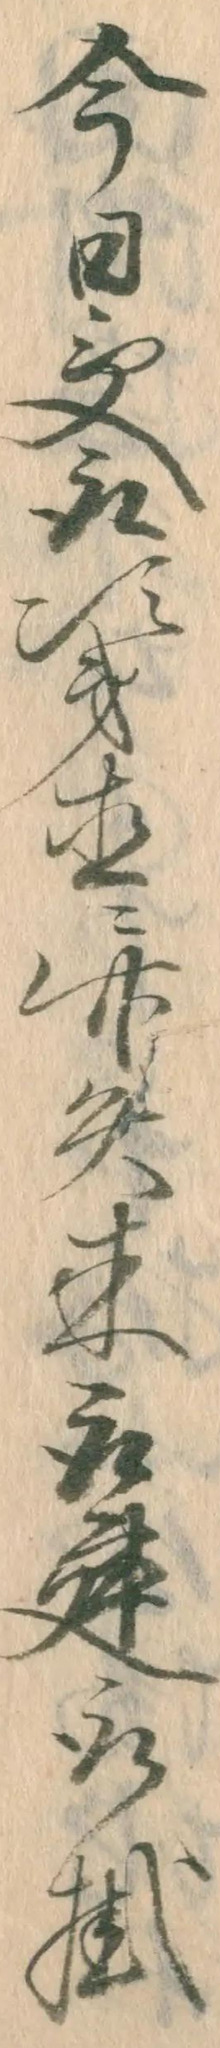今日受取次第直ニ竹矢来取建取掛
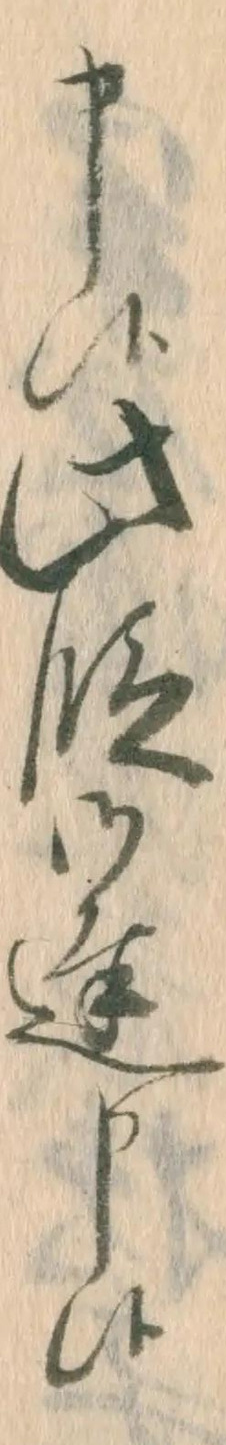申候此段御達申候
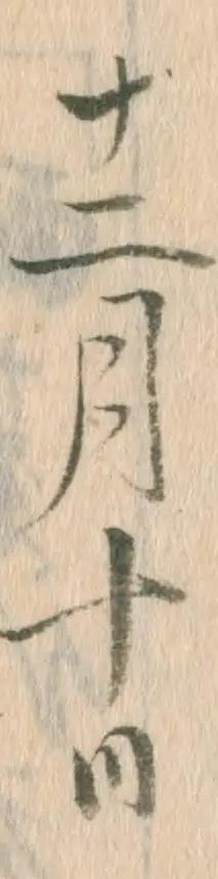十二月十日
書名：七十冊物類集 71巻. [44] 四十三 牢屋敷御普請御修覆地震ニ付骨折候牢屋掛御褒美之部
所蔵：国立国会図書館 National Diet Library, JAPAN
